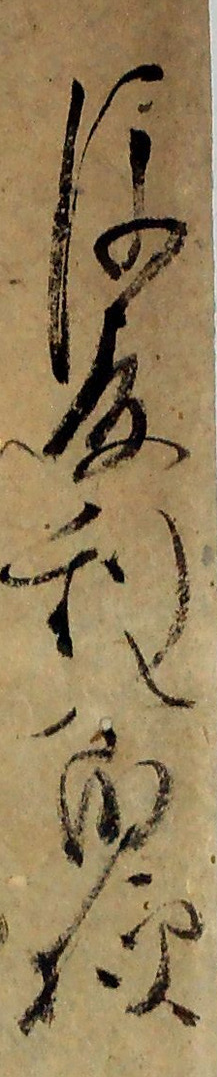後藤利八郎様

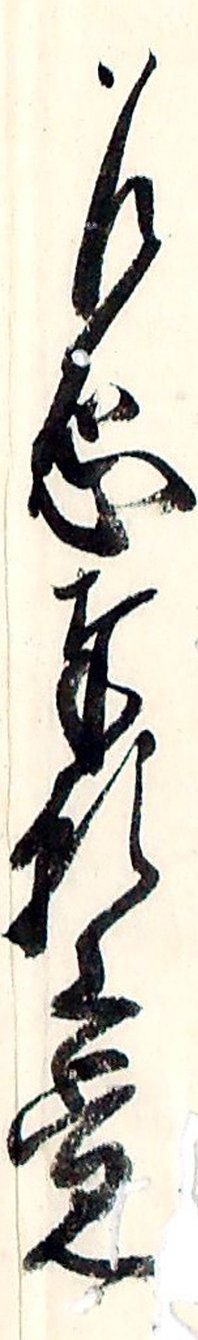乍恐奉願上覚
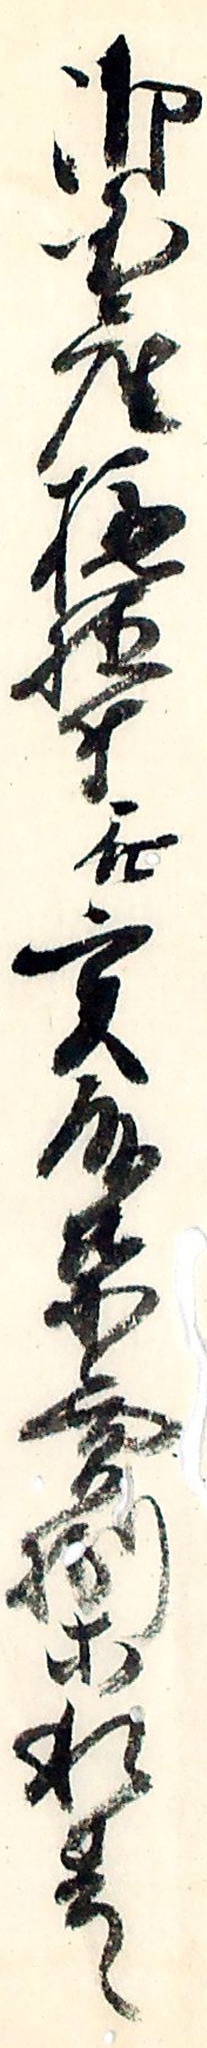御国産櫨植付幷実取集売捌等私共へ
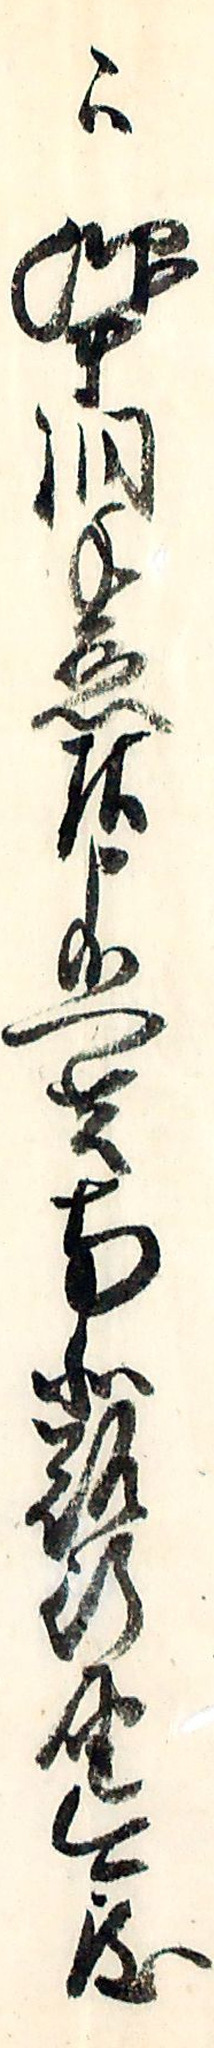被仰付相手懸居申候へ共南北難行届今度
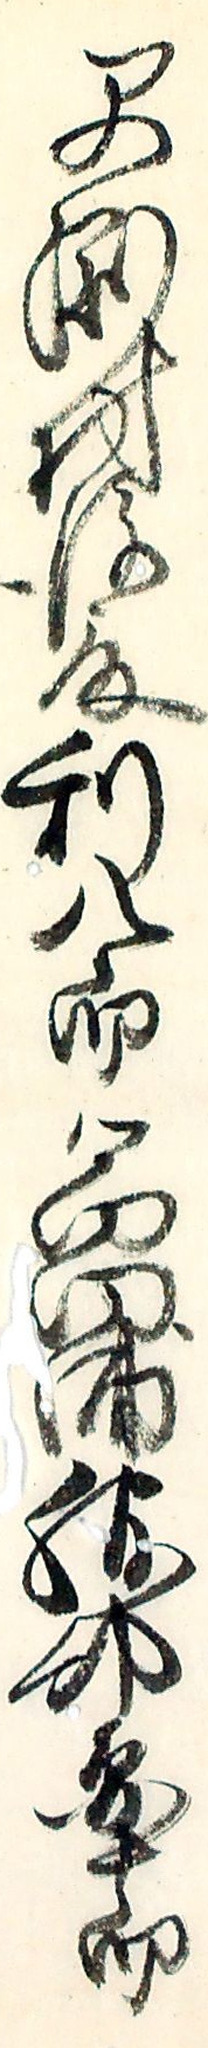早淵村後藤利八郎冨田浦服部円十郎
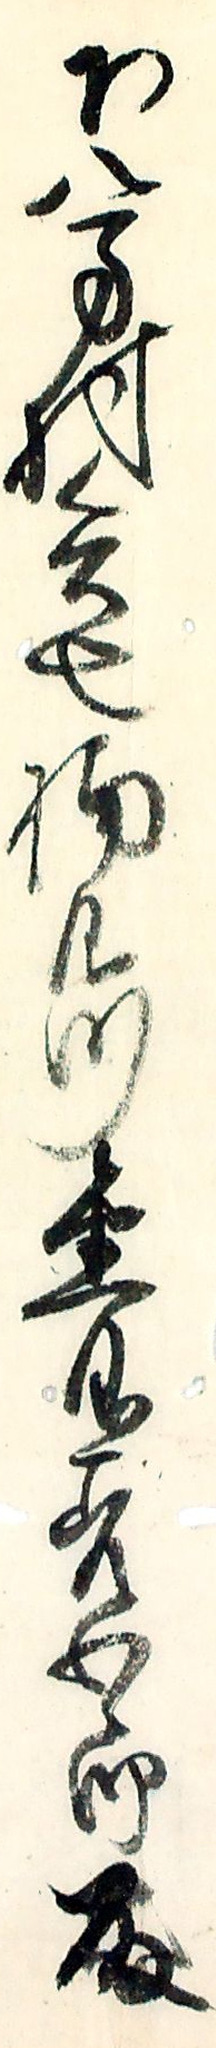下八万村兵七桶屋町金屋善五郎取
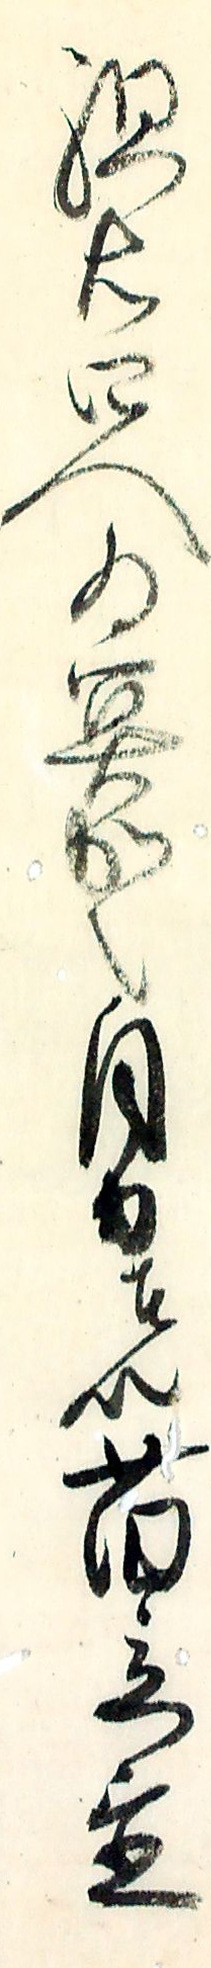組右四人為冥加之自力を以苗立置
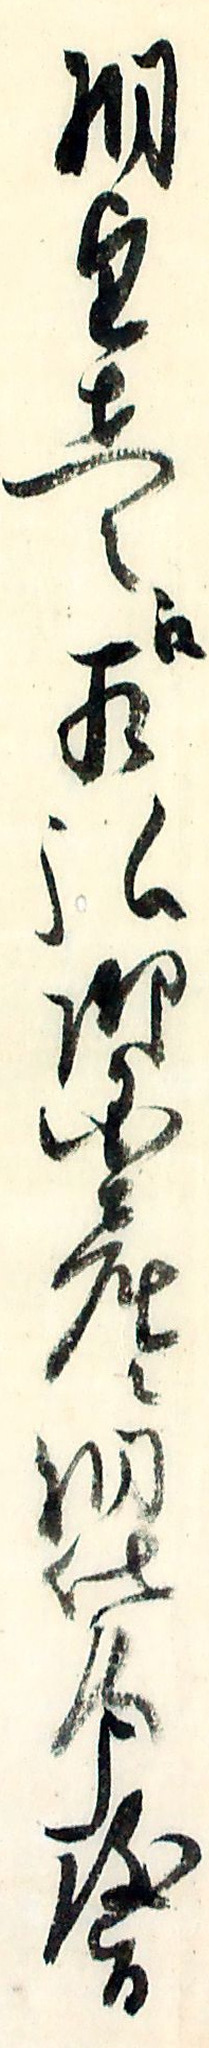相望在々え相弘御国産に相仕居申度旨
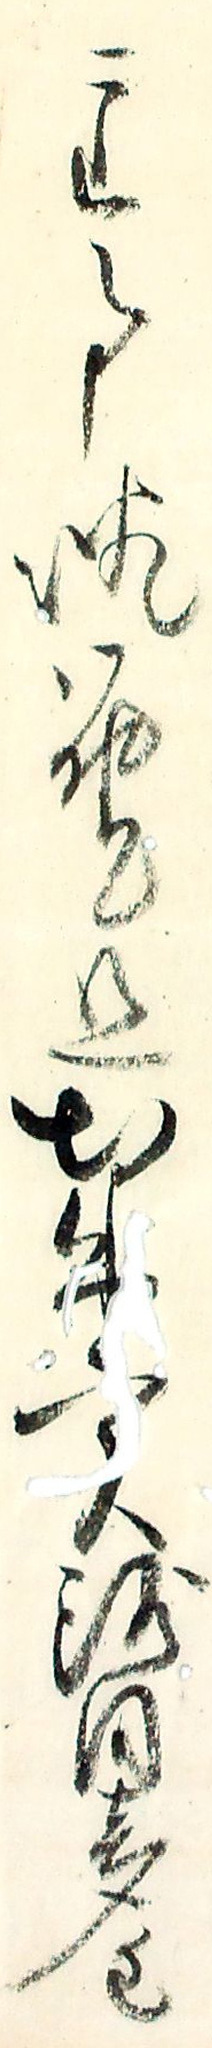重々申談御坐候且出来実銀目壱〆匁
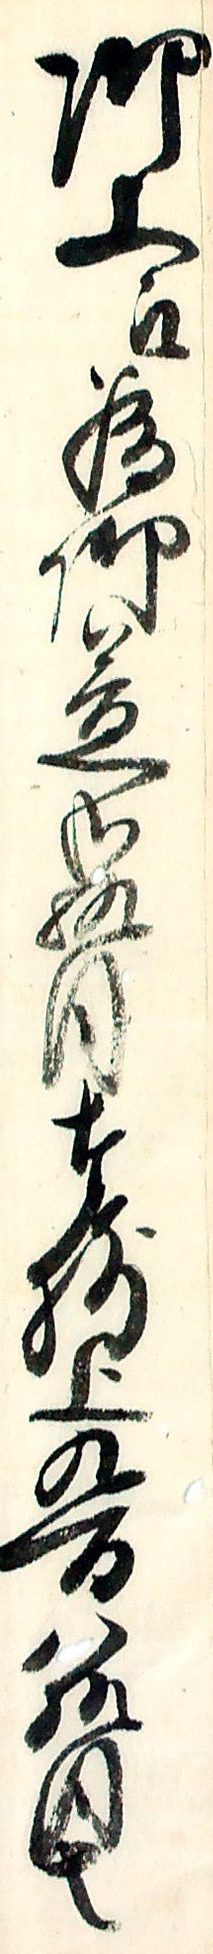御上え為御益弐拾目奉指上九百八拾目は
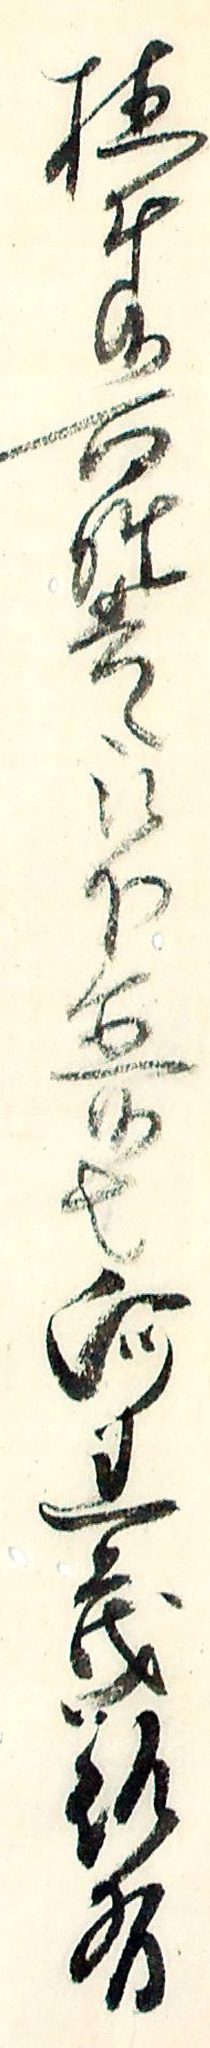植付候百姓共へ被下置候は何れも難有
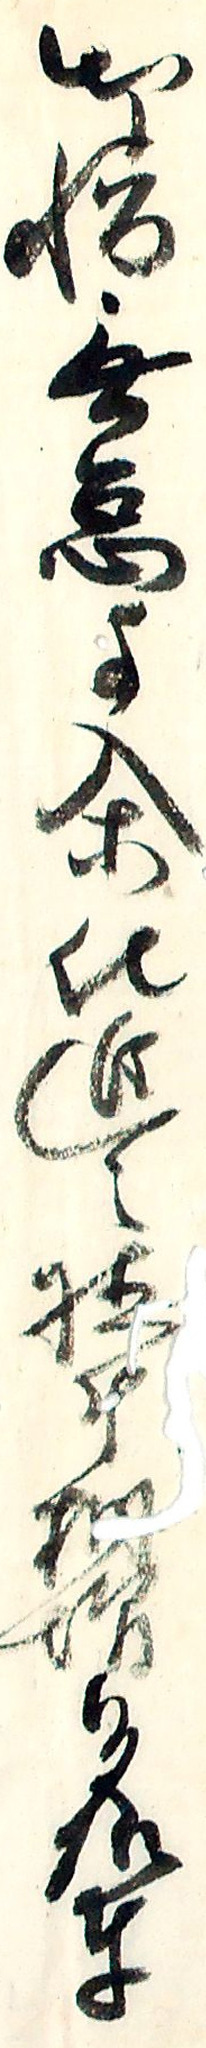出精無怠手入等仕近々植付相増候様奉
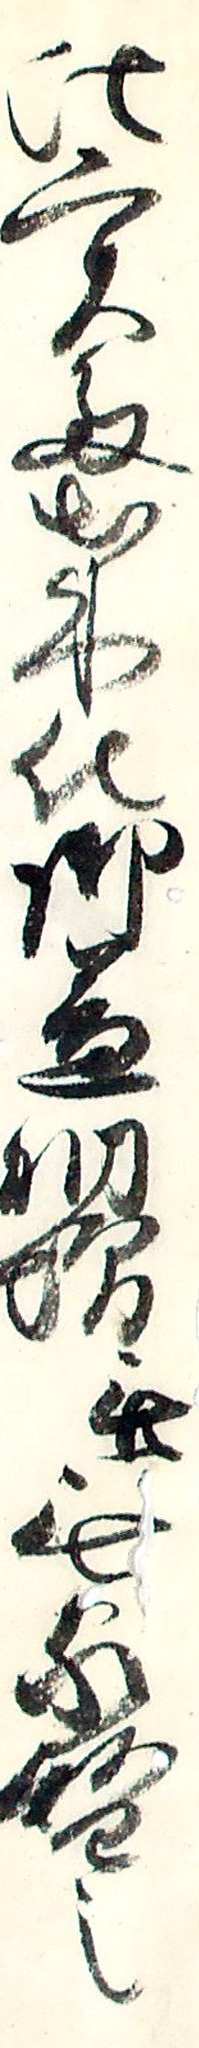仕実多出来仕御益相増幷無家督之

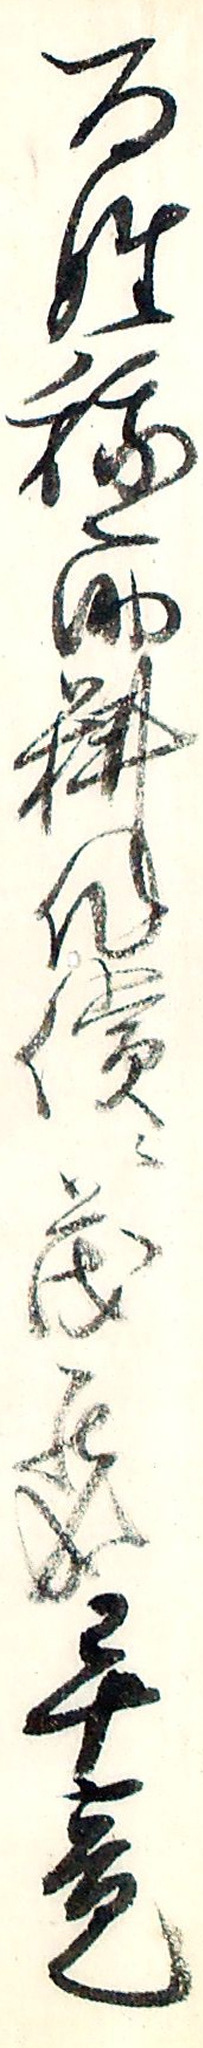百姓稼筋耕作償にも罷成畢竟
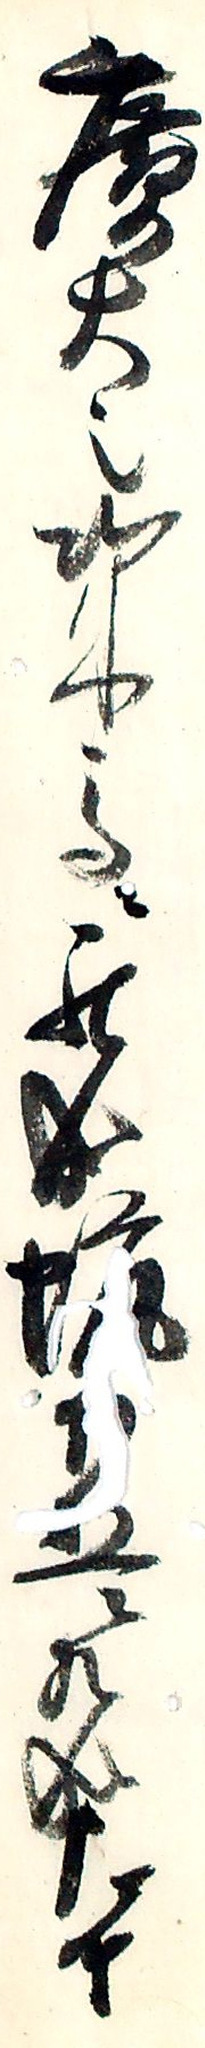広大之出来高と罷成蝋下直に相成申に付
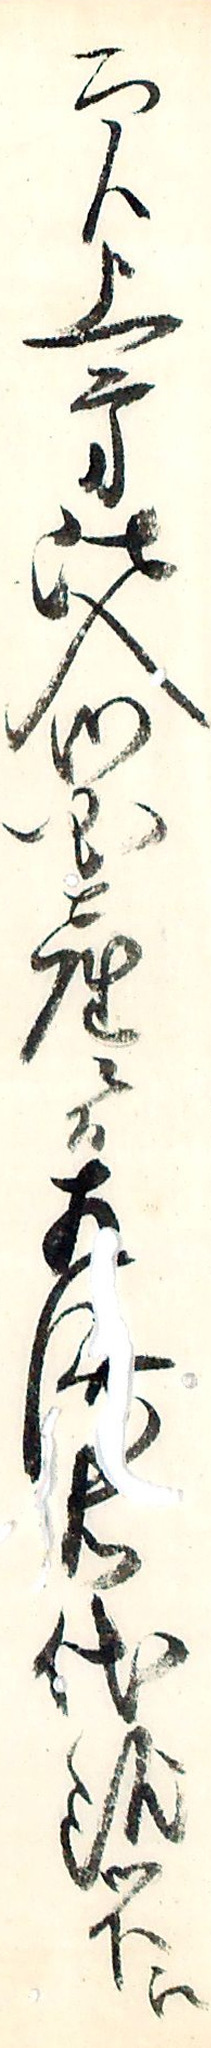而は上方仕入御国産に而相済右代銀御下え
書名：乍恐奉願上覚（御国産櫨植付並実取集売捌等)他
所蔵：鳴門教育大学 Naruto University of Education
